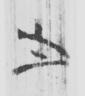之
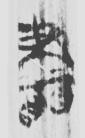{聿皕}
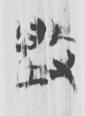毀
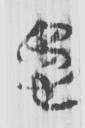{矛心}
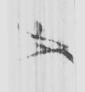之
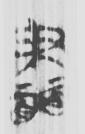{聿皕}
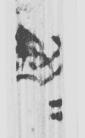釰=
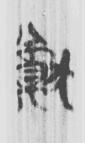{奠犬}
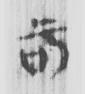可
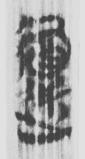復
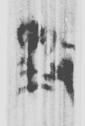毀
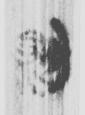則
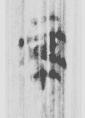不
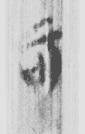可
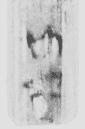{廿二}
